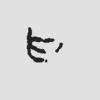曰
